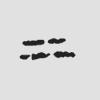二
